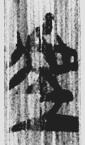𫊟
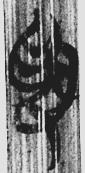爯
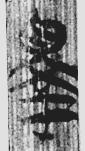睪
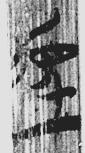𫊟
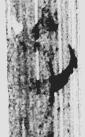父
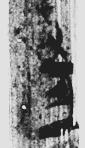{兄㞷}
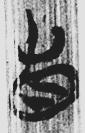眚
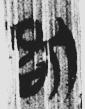咎
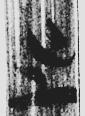之
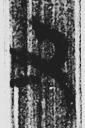有
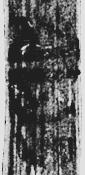善
